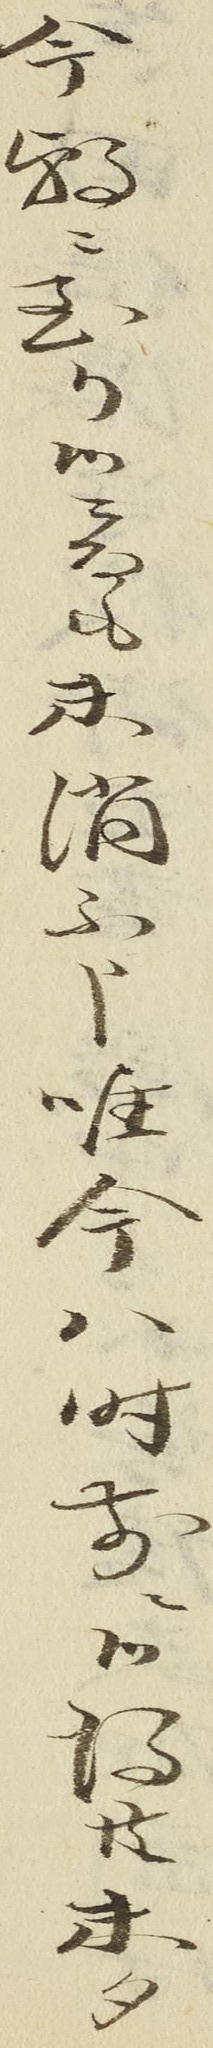今朝に至り候而も未消不申唯今八ッ時前二候得共未タ
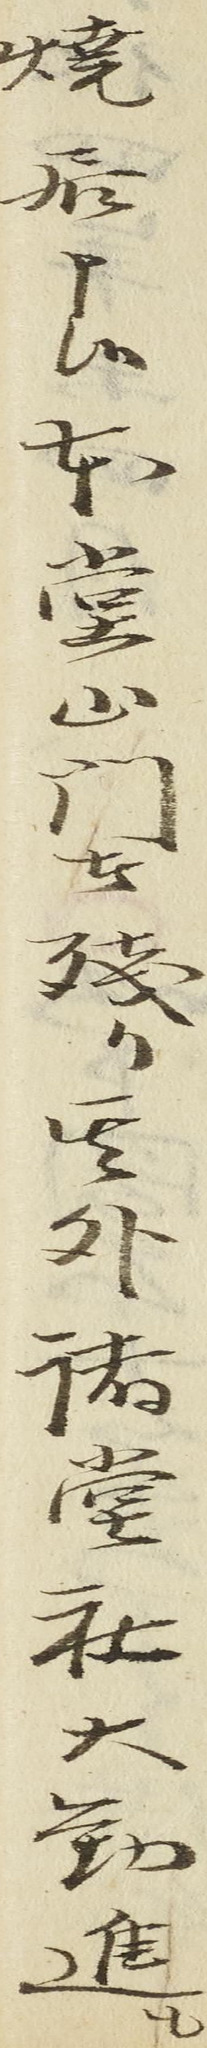焼居申候本堂山門は残り其外諸堂社大勧進も
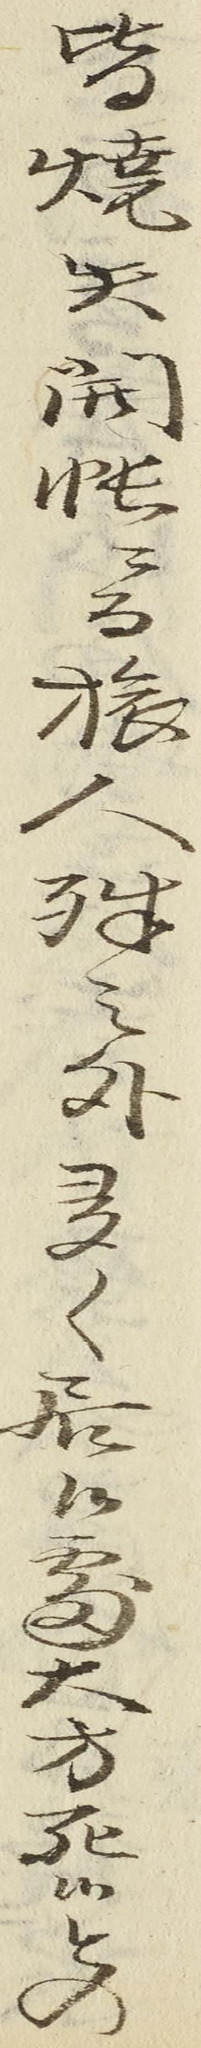皆焼失開帳二而旅人殊之外多く居候処大方死候との
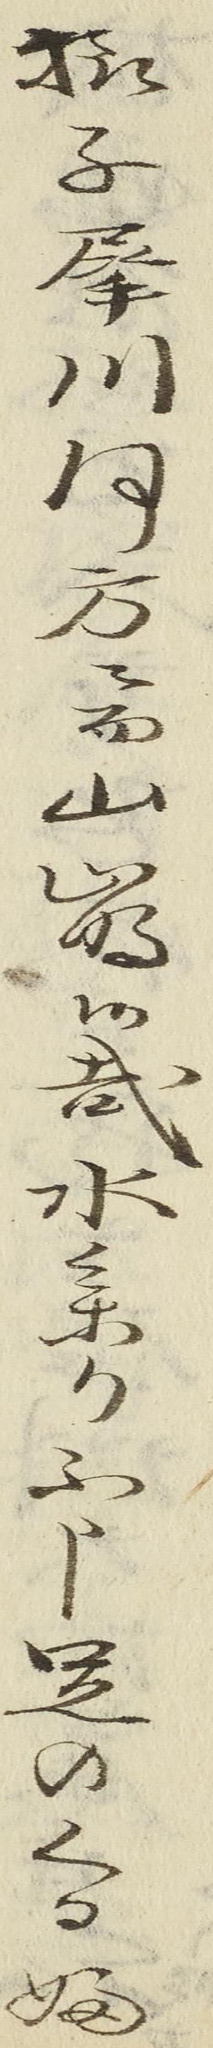様子犀川何方二而山崩候哉水参り不申候足のくるふ
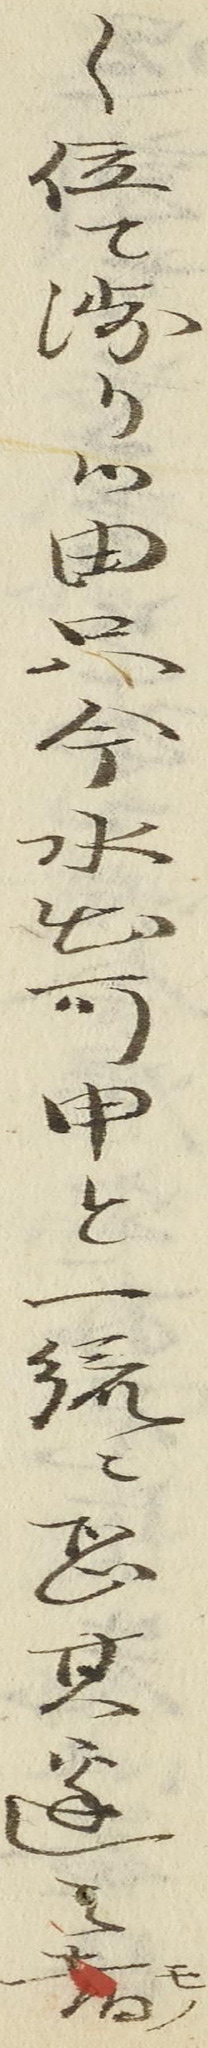し位て渉り候由只今水出可申と一統二恐其辺之者
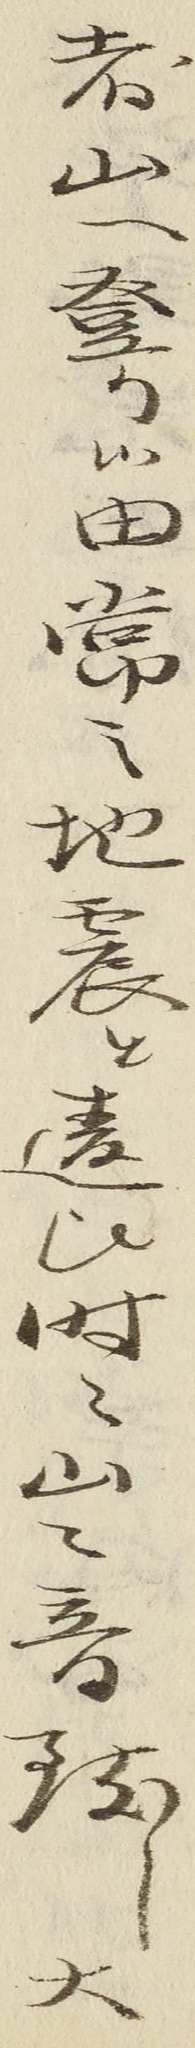は山へ登り候由常之地震と違ひ時々山々音致し大
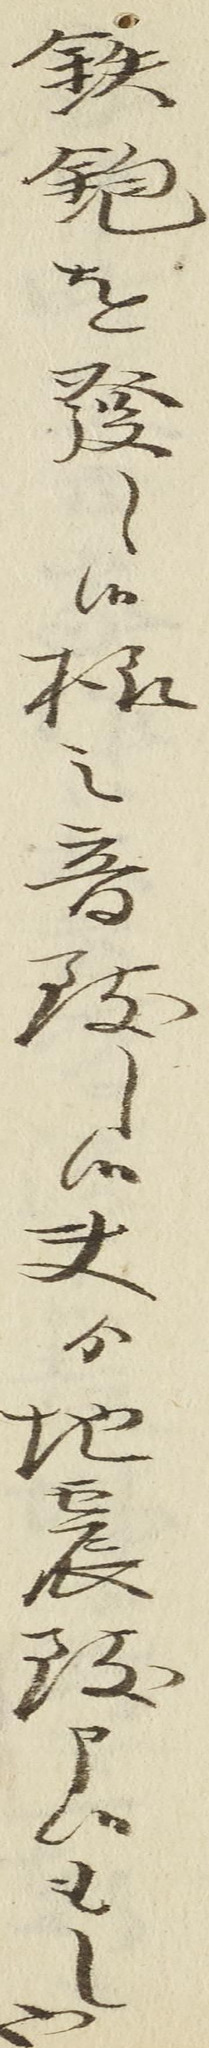鉄鉋を発し候様之音致候夫ゟ地震致申候もしや
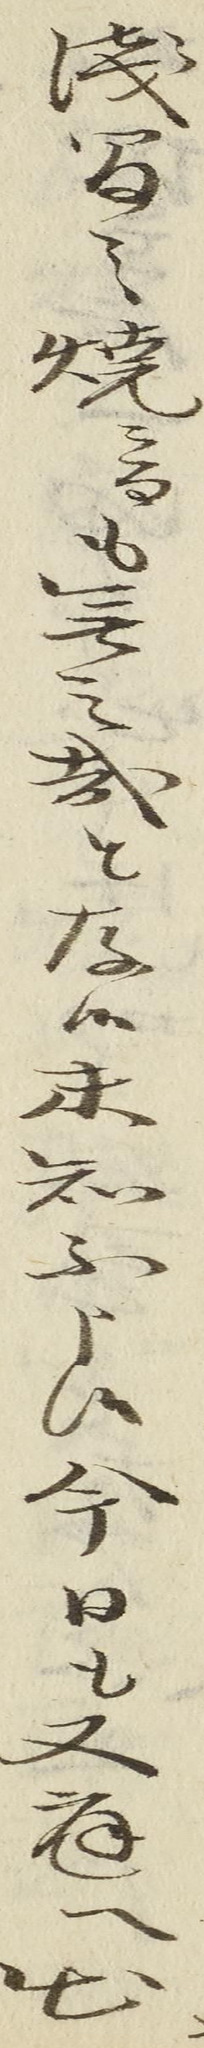浅間之焼二而も無之哉と存候未知不申候今日も又庭へ出
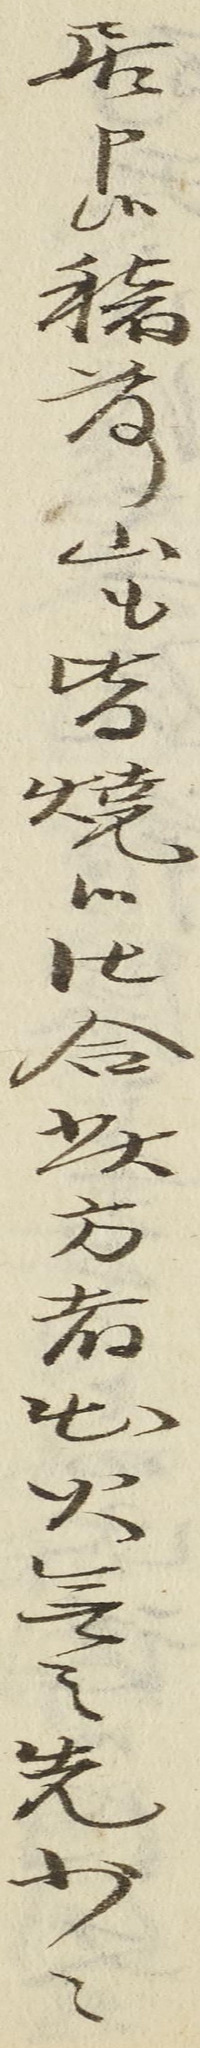居申候稲荷山も皆焼候仕合此方は出火無之先少々
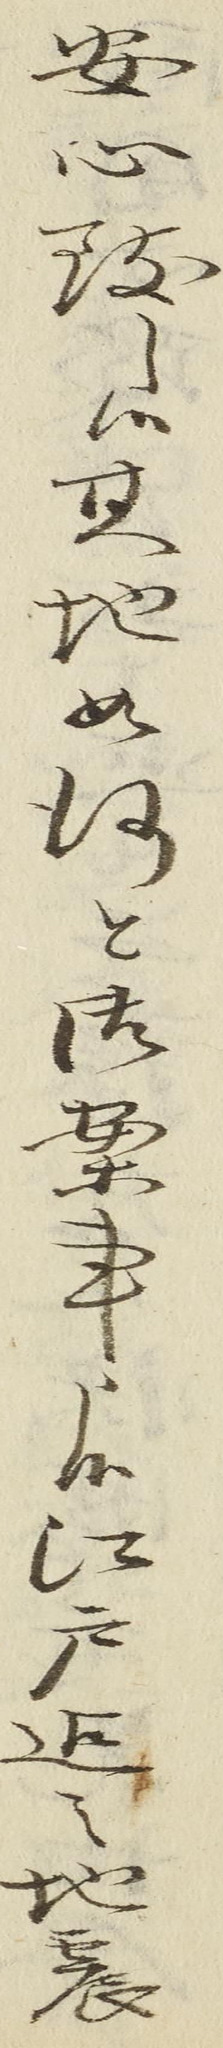安心致候其地如何と御案事申候江戸迄之地震
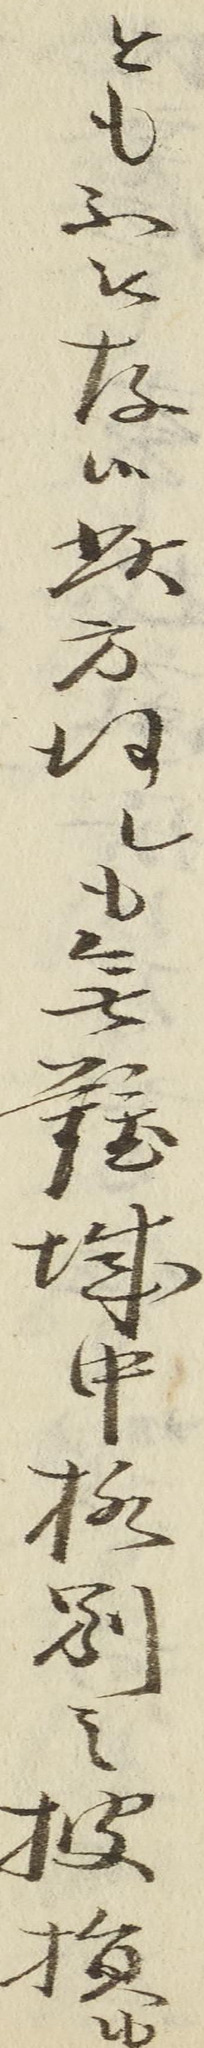とも不被存候此方何ㇾも無難城中格別之破損も
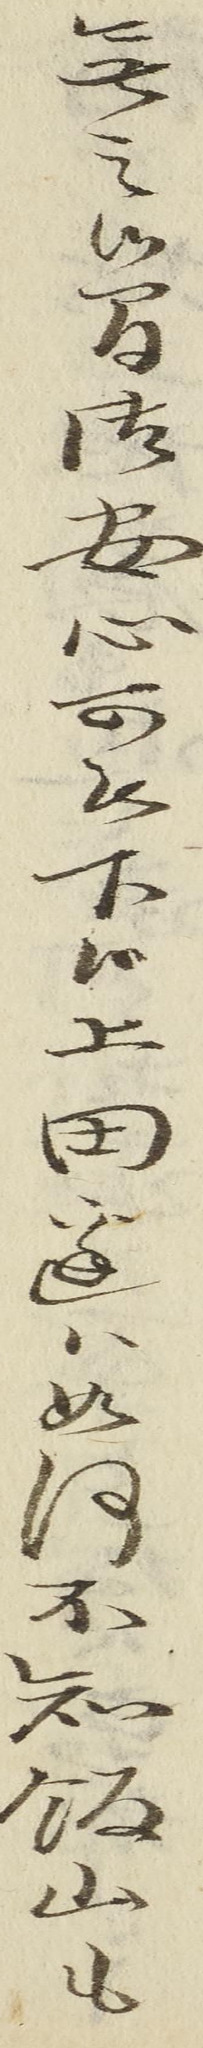無之候間御安心可被下候上田辺ハ如何不知飯山も
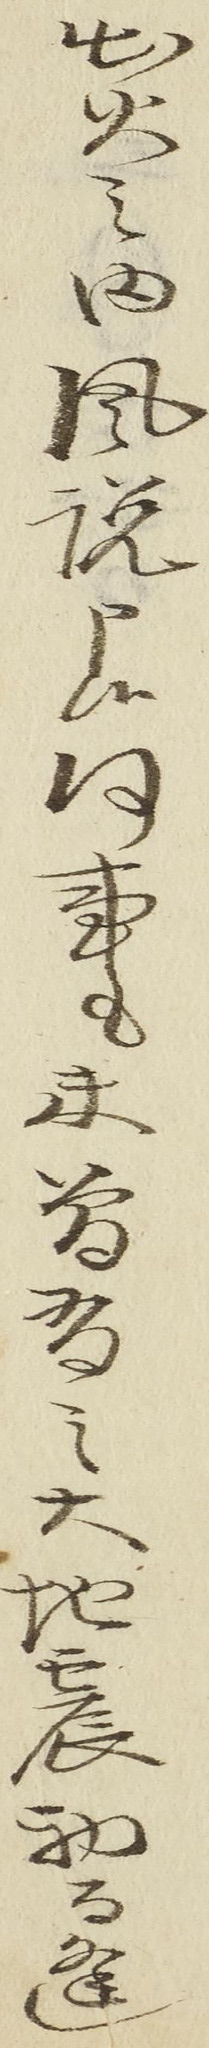出火之由風説申候何事も未曾有之大地震初而逢
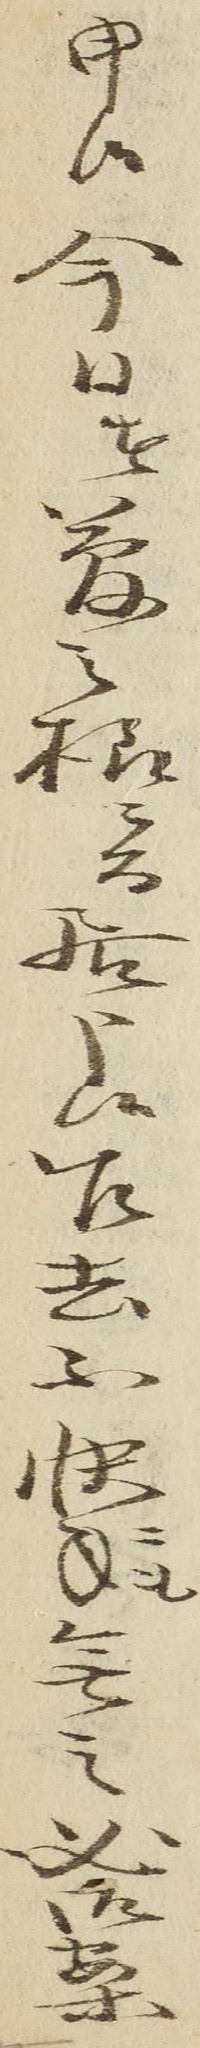申候今日は夏之様二而居申候乍去不快二も無之必御案

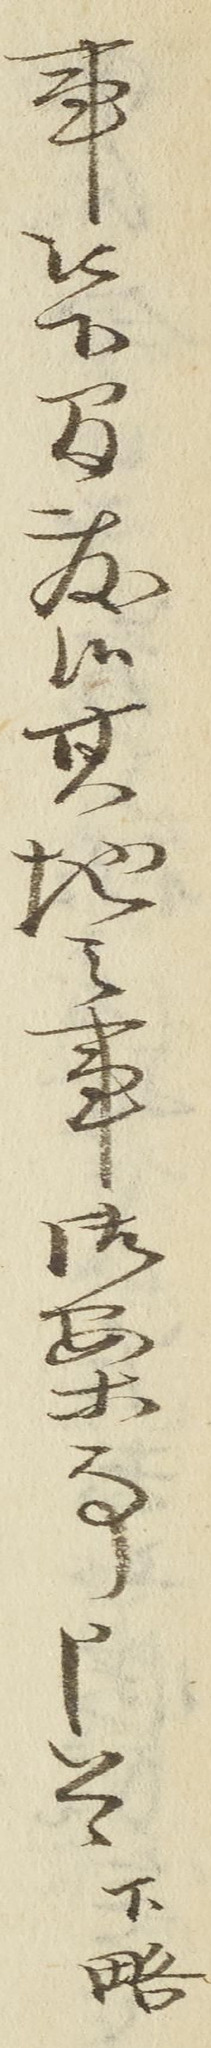事被下間敷候其地之事案事申上候下略
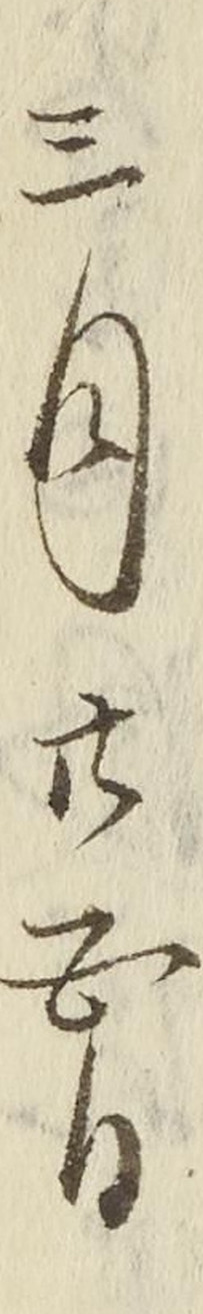三月廿五日
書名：信濃國大地震記　乾
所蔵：東京大学地震研究所図書室 Earthquake Research Institute Library, The University of Tokyo, JAPAN
